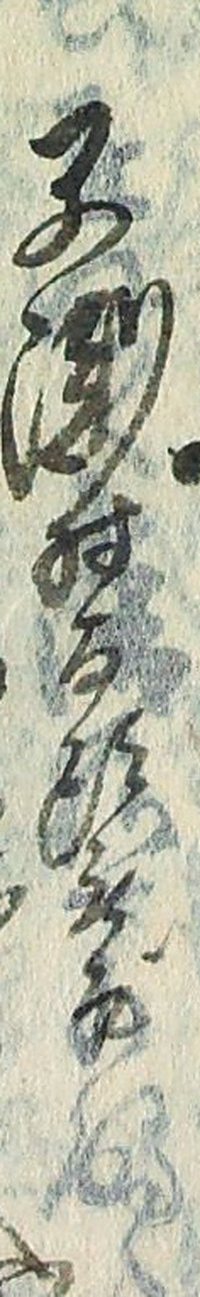早淵村与頭庄屋
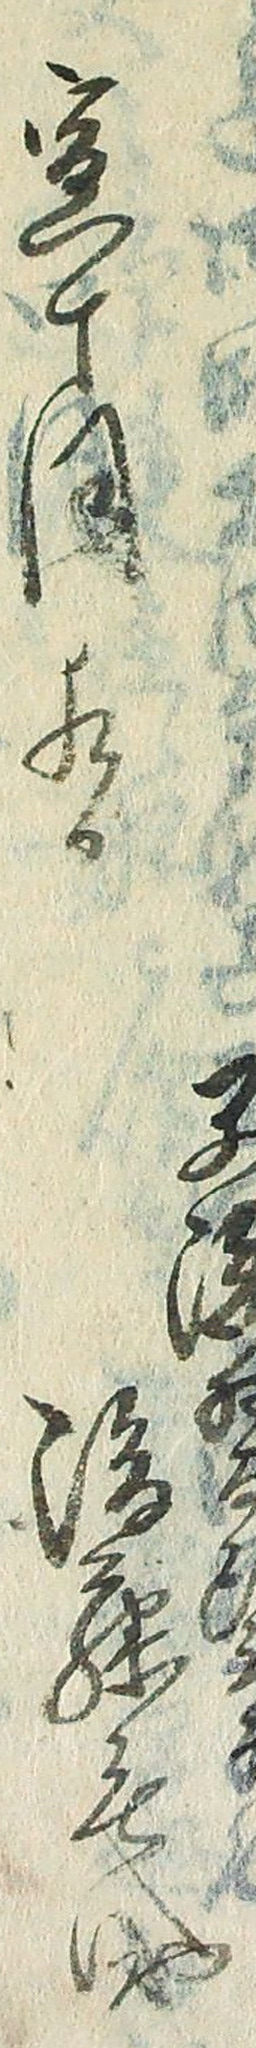寅十月九日後藤庄助
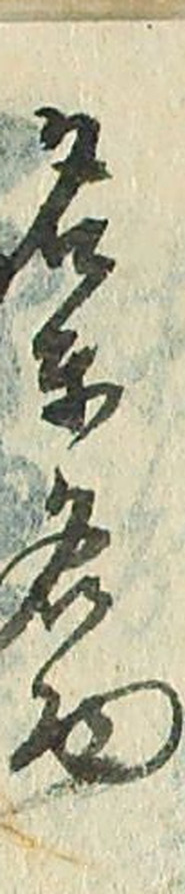名東名西
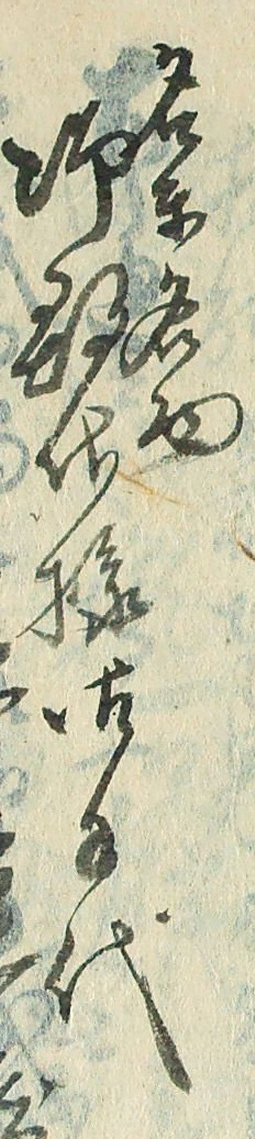御郡代様御手代
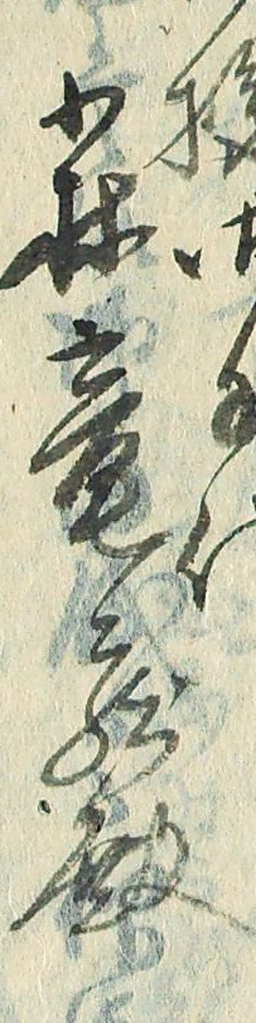小林竜蔵殿

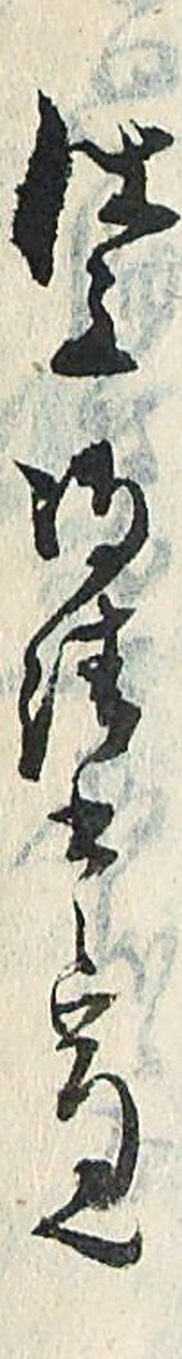仕上御請書之覚
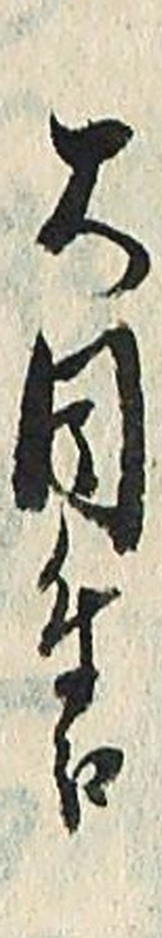大目付江
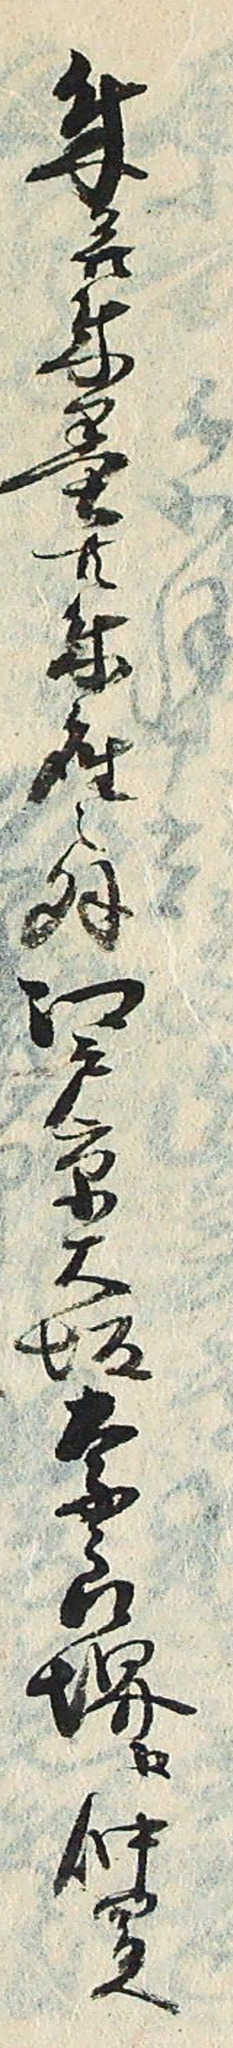朱幷朱墨共朱座之外江戸京大坂奈良堺え仲買
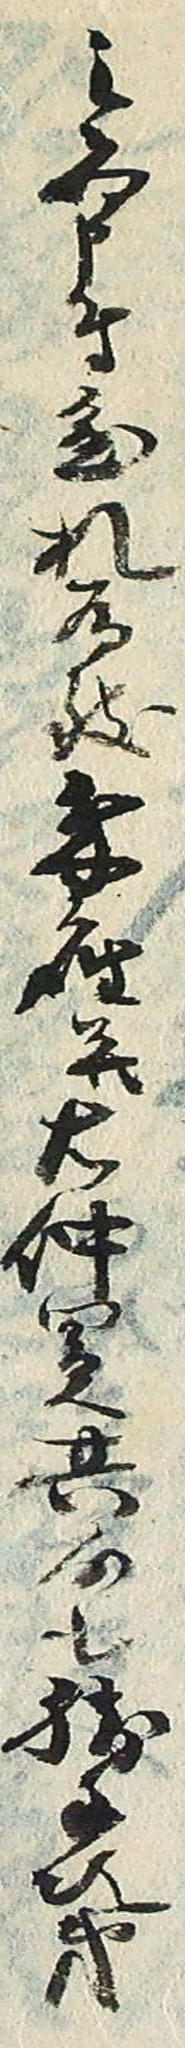之者申付懸札為致朱座幷右仲買共ゟも勝手次第
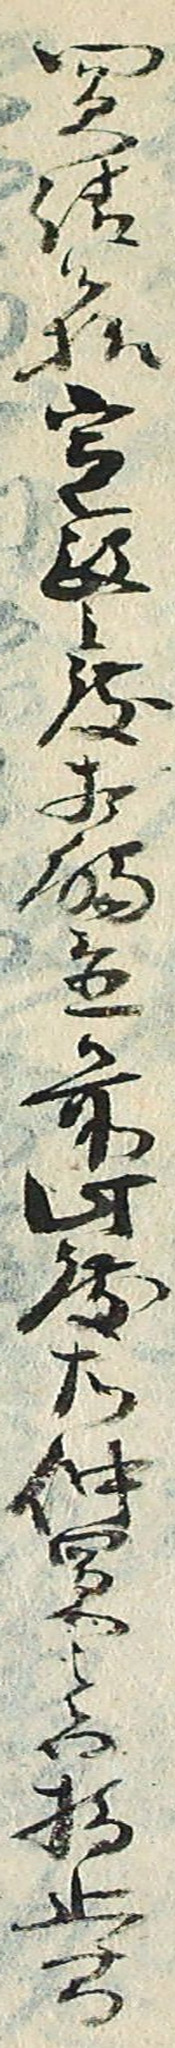買請候様寬政之度相触置候所此度右仲買之者指止候間
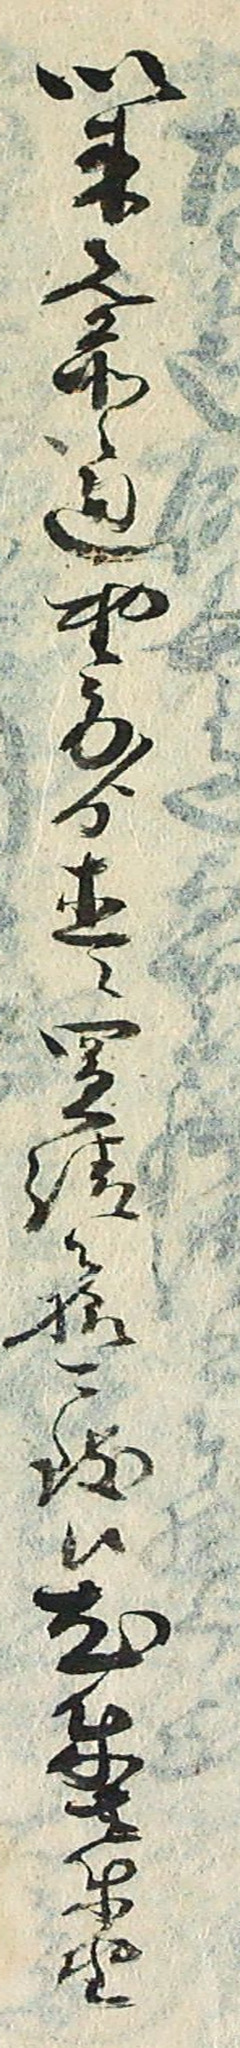以来先前之通坐方ゟ直々買請候様可致候尤朱は朱坐
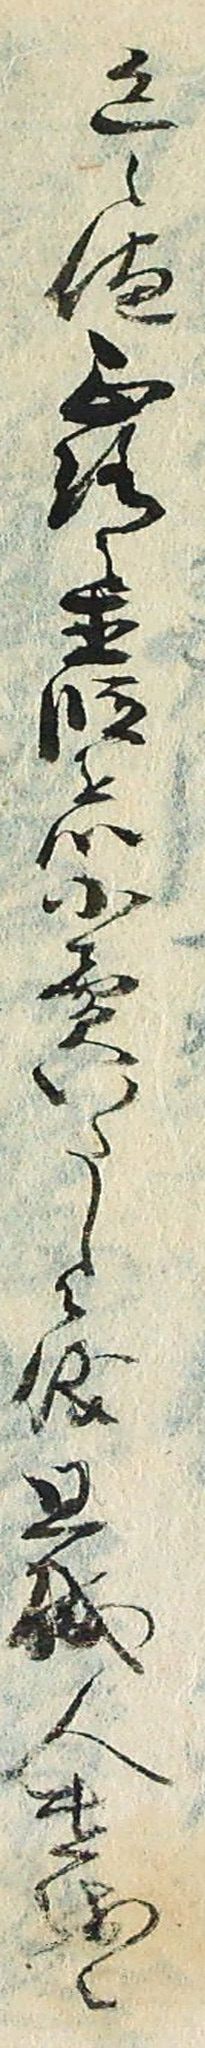包之儘正路之直段を以小買いたし候儀且職人遣
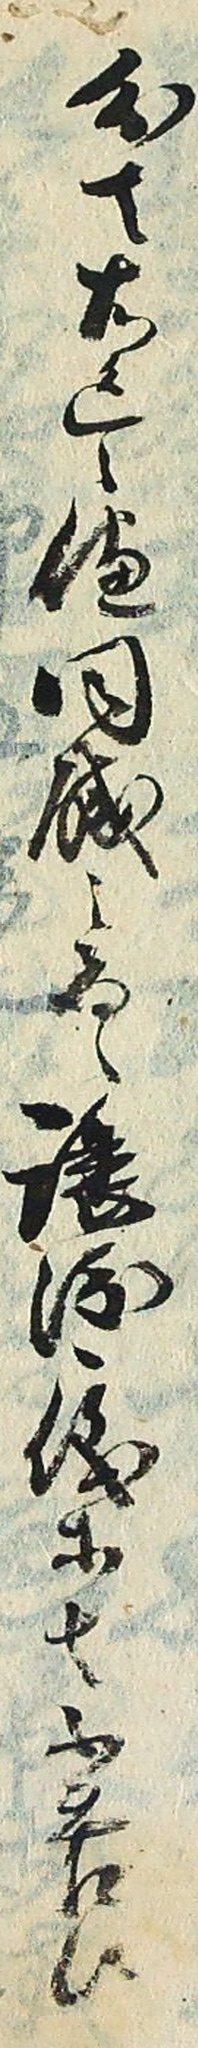分は右包之儘同職之者へ譲渡候儀等は不苦候
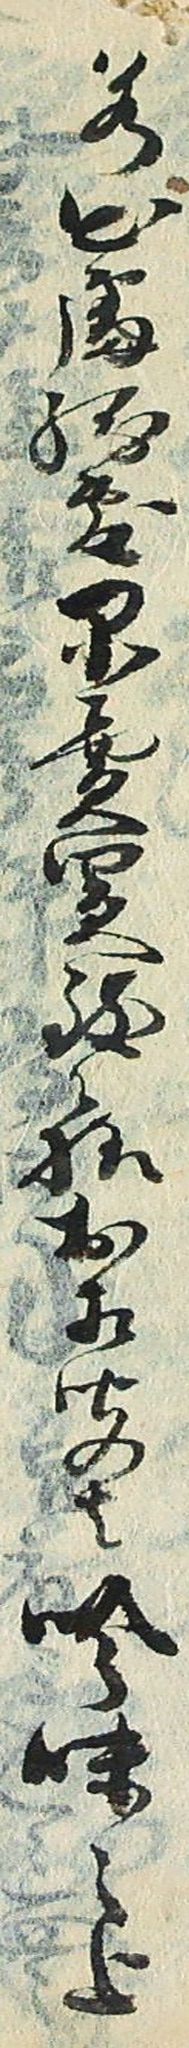若出処紛敷品売買致候様於相聞は吟味之上
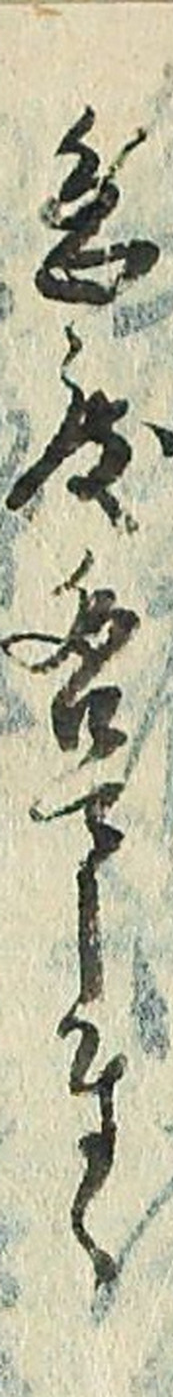急度咎可申付候
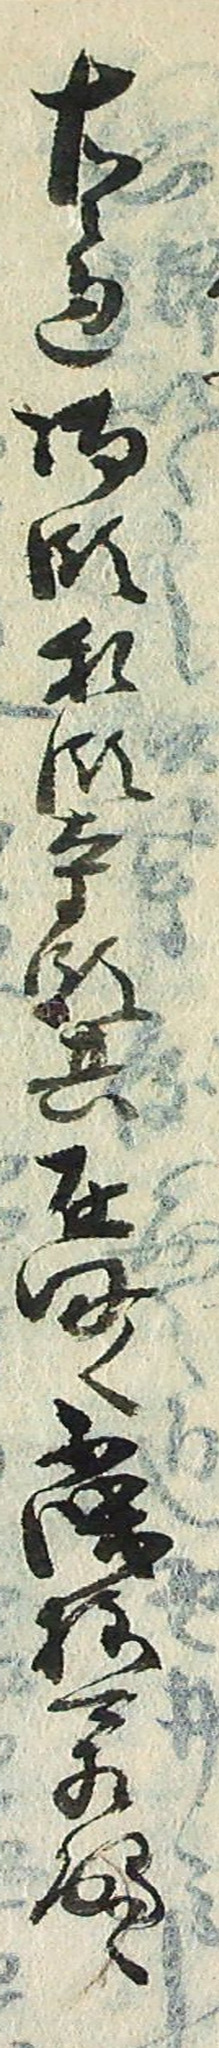右之通御領私領寺領共在町へ不洩様可相触候
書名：諸御用御□受書控
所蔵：鳴門教育大学 Naruto University of Education
